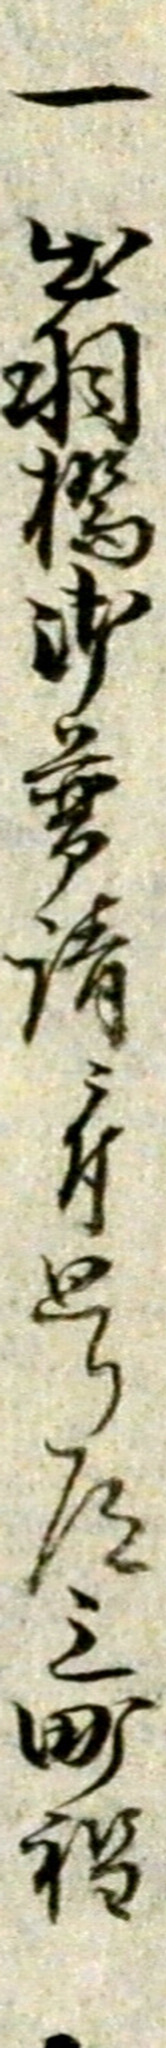一出羽橋御普請ニ付廻り道三町程
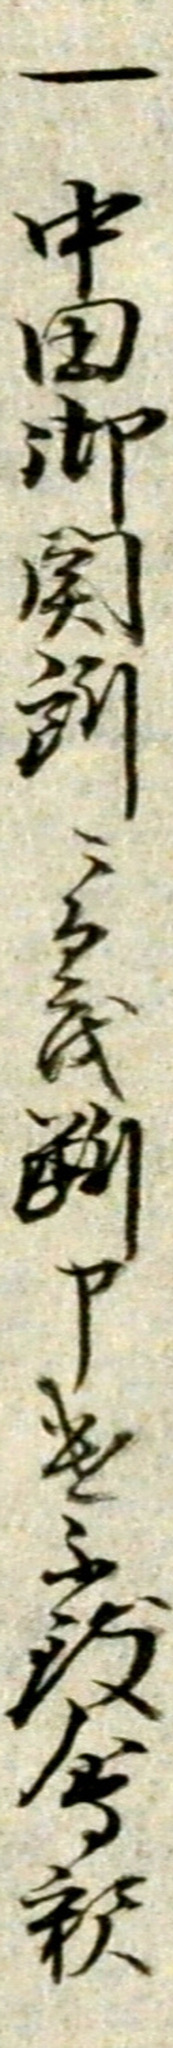一中田御関所ニ而も断申遣不致会釈
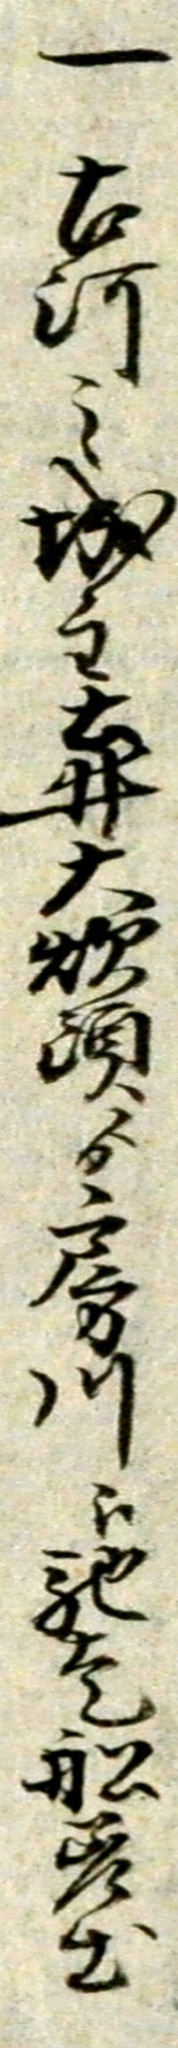一古河之城主土井大炊頭ゟ房川江馳走船差出
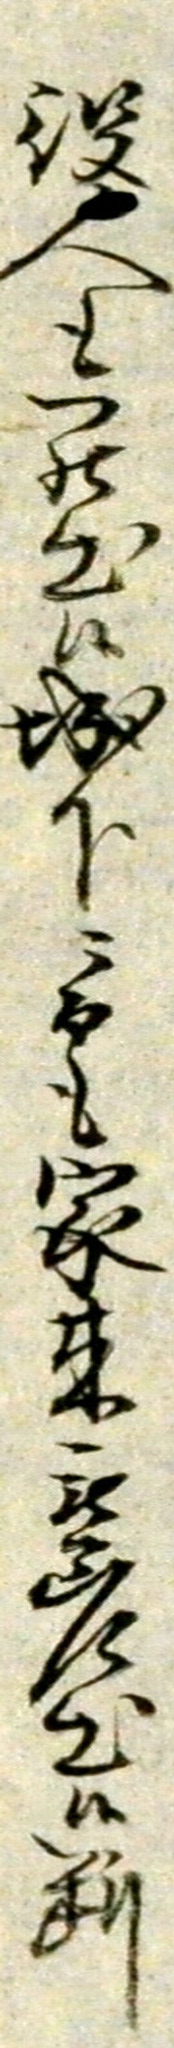役人も罷出候城下ニ而も家来被差出候所
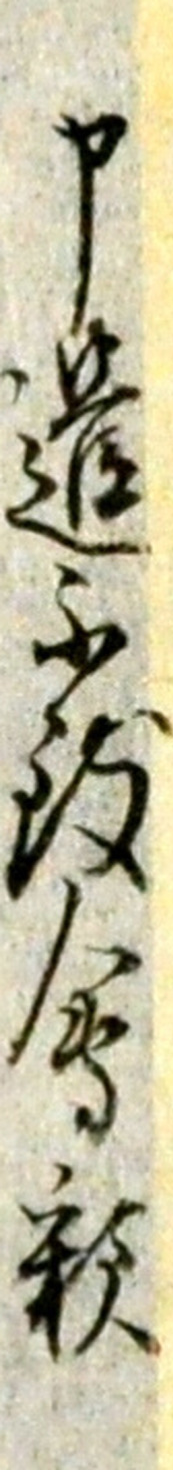申遣不致会釈
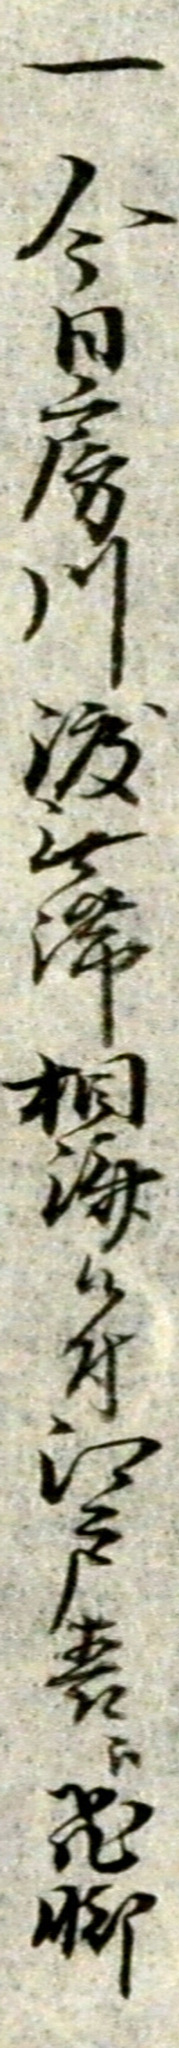一今日房川渡無滞相済候付江戸表江飛脚
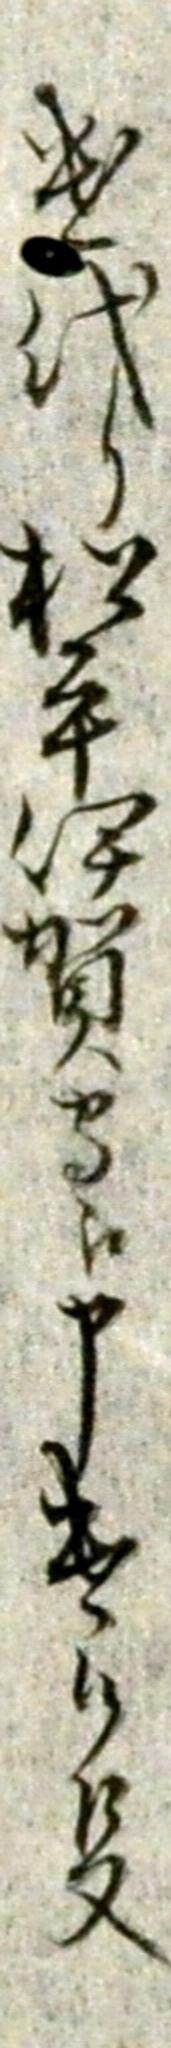遣代り松平伊賀守江申遣候事
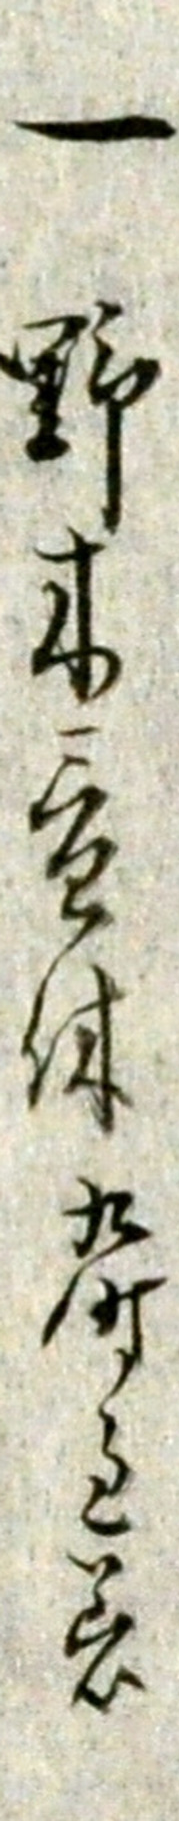一野木昼休九時過着
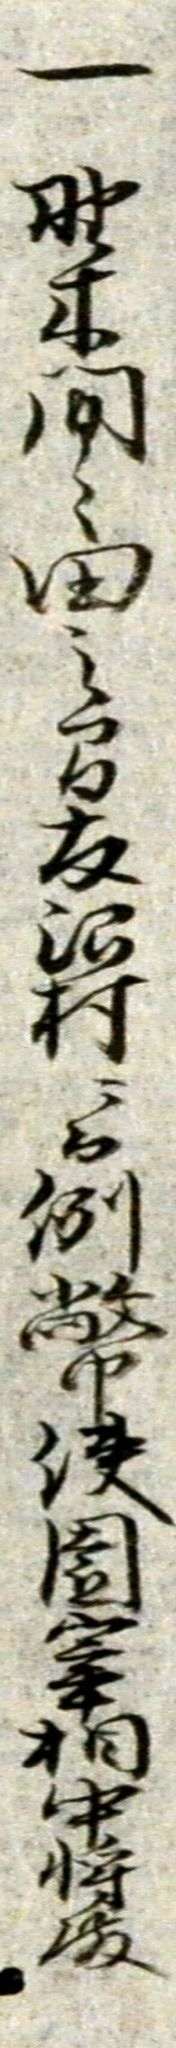一野木間々田之間友沼村ニ而例幣使園宰相中将殿
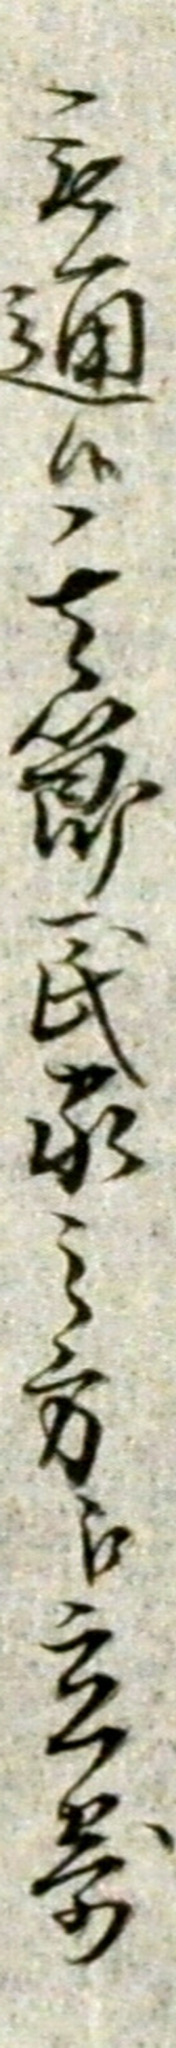被通候其節民家之方江立寄
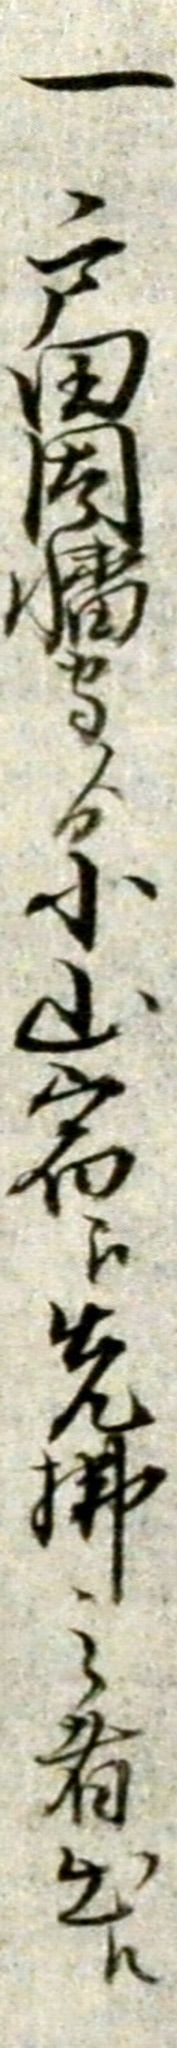一戸田因幡守ゟ小山宿江先払之者出ル
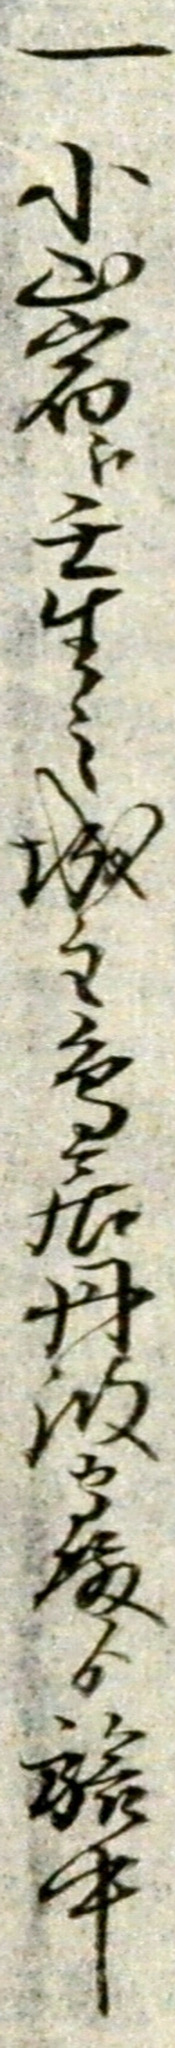一小山宿江壬生之城主鳥居丹波守殿ゟ旅中

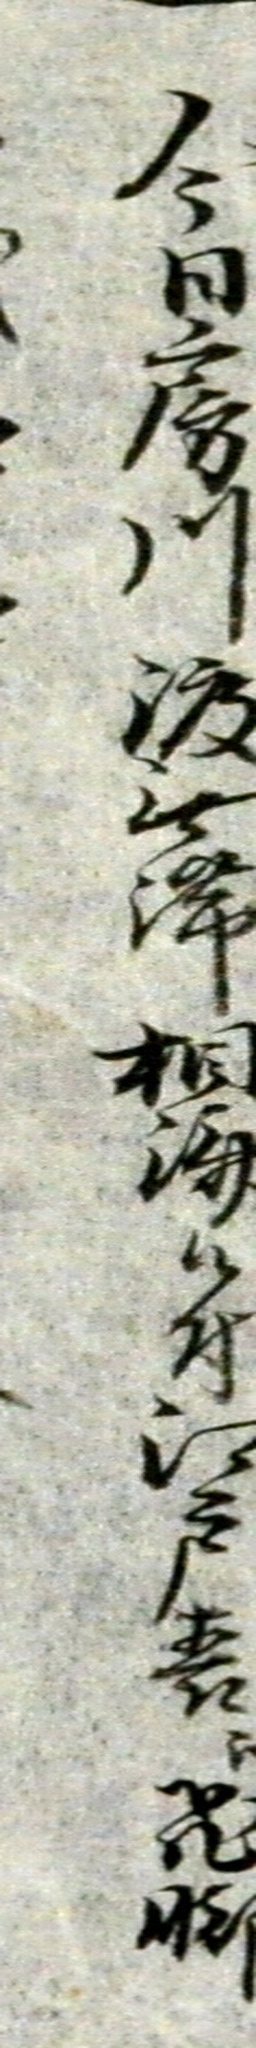一今日房川渡無滞相済候ニ付江戸表江飛脚
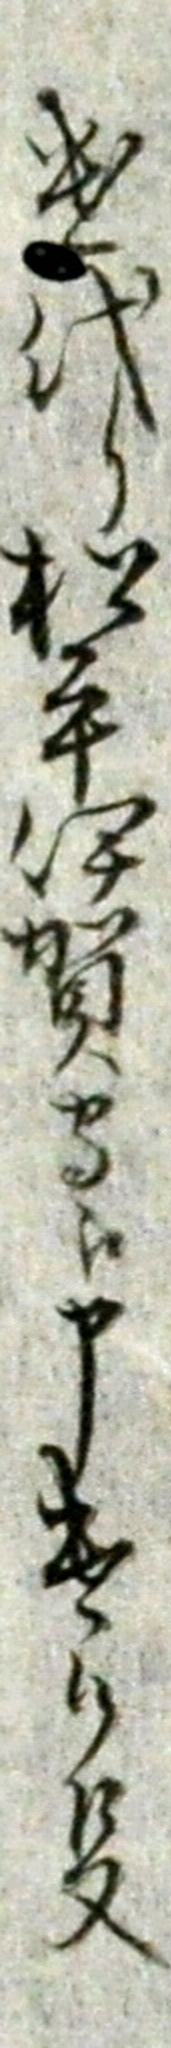遣代り松平伊賀守江申遣候叓
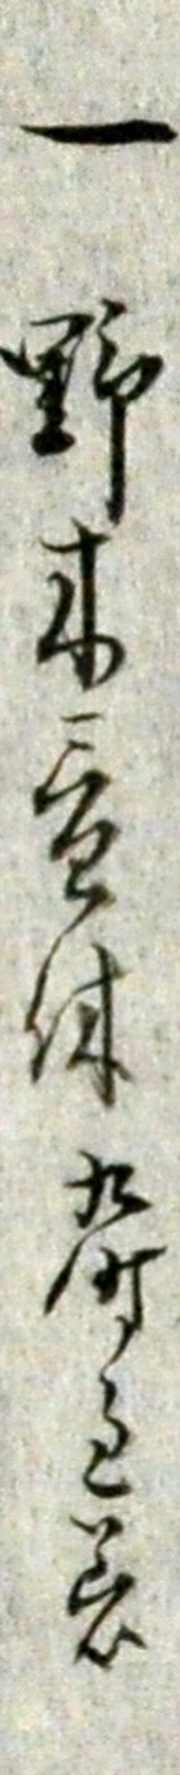一野木昼休九時過着
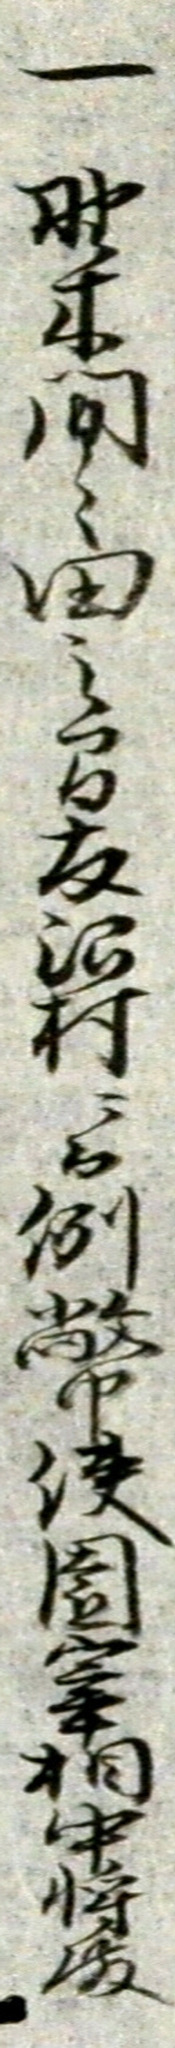一野木間々田之間友沼ニ而例幣使園宰中将殿
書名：日光御名代相勤候節ノ留
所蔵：伊那市立高遠町図書館・合同会社AMANE
